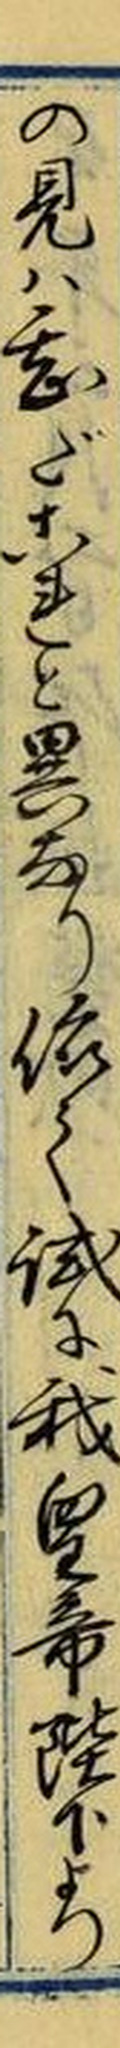の見ハ甚だこれと異なり依て誠に我皇帝陛下より
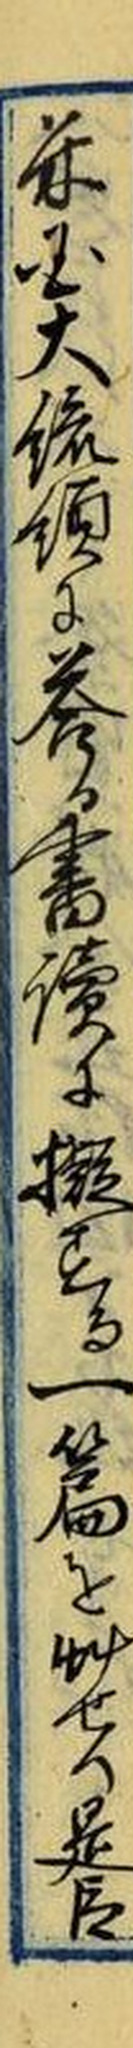米国大統領に答る書読に擬する一篇を草せり是臣
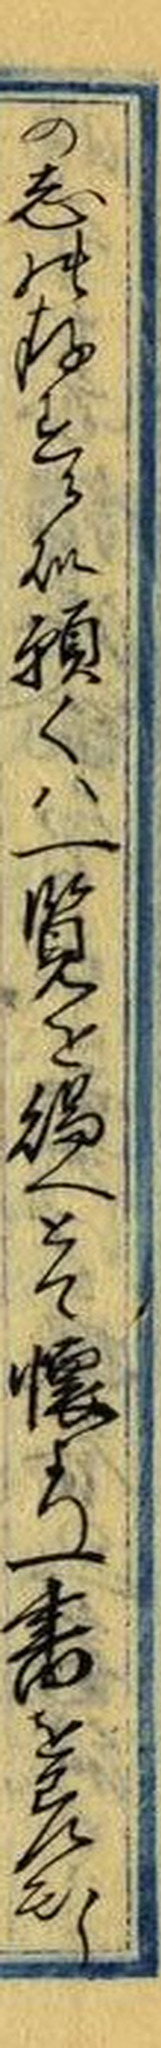の志の存する処願くハ一覧を賜へとて懐より一書を差出し
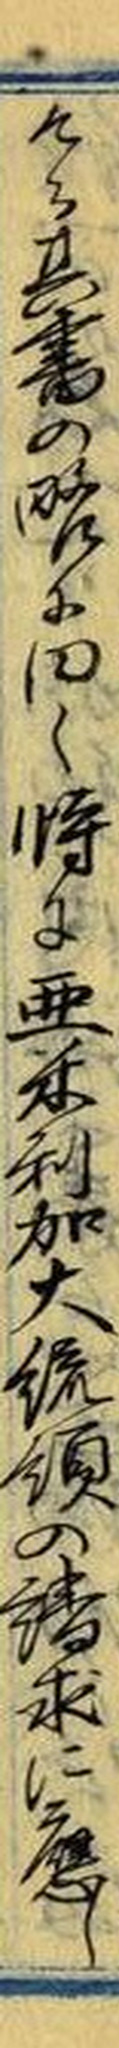ける其書の略に曰く時に亜米利加大統領の請求に応じ
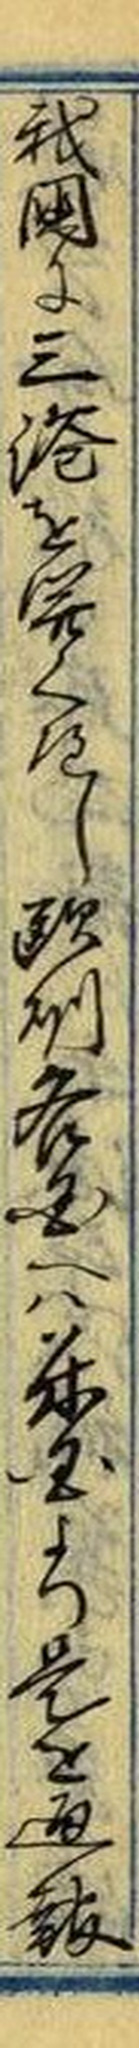我国に三港を開くへし欧州格国へハ米国より是を通報
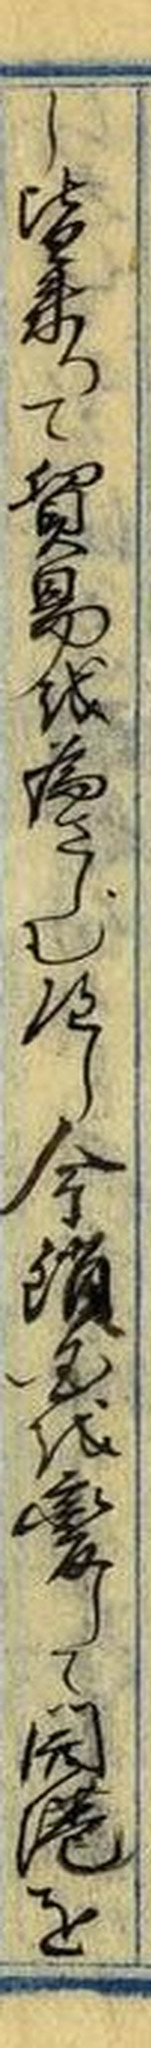し皆来りて貿易そ為さしむへし今鎖国を変して開港を
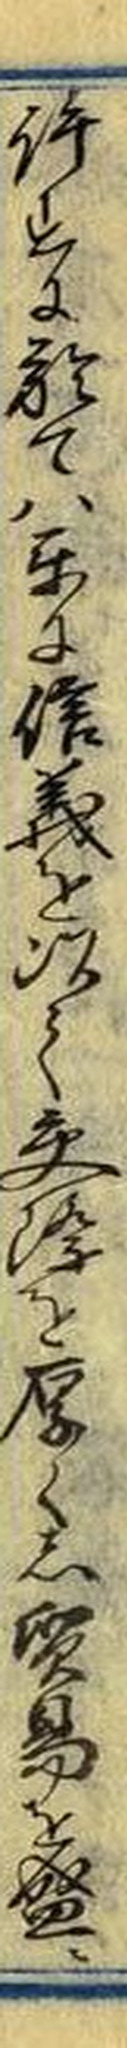許すに於てハ互に信義を以て交際を厚くし貿易を盛ニ
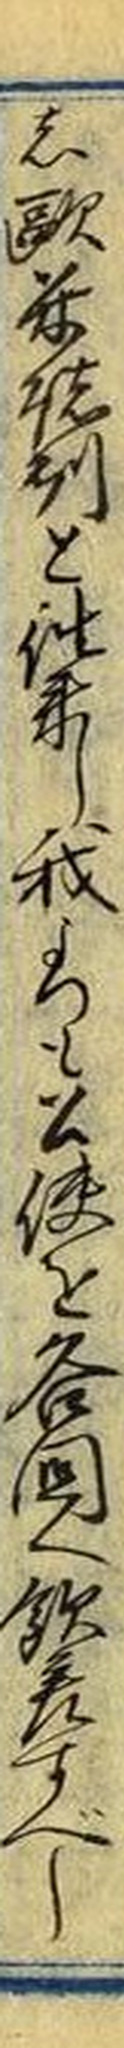し欧米諸州と往来し我よりも公使を各国へ飲差すべし
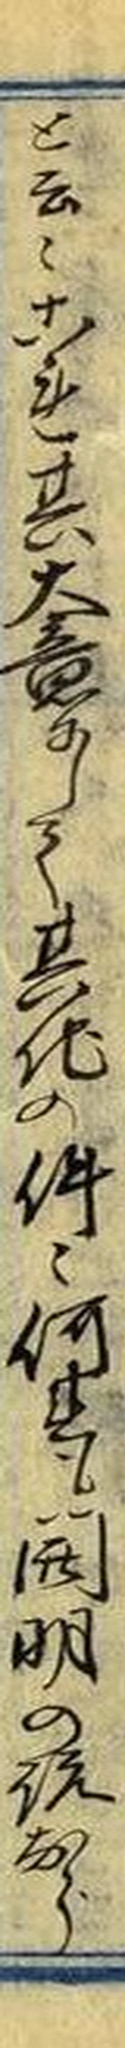と云々これ其大意にして其他の件々何れも開明の説なら
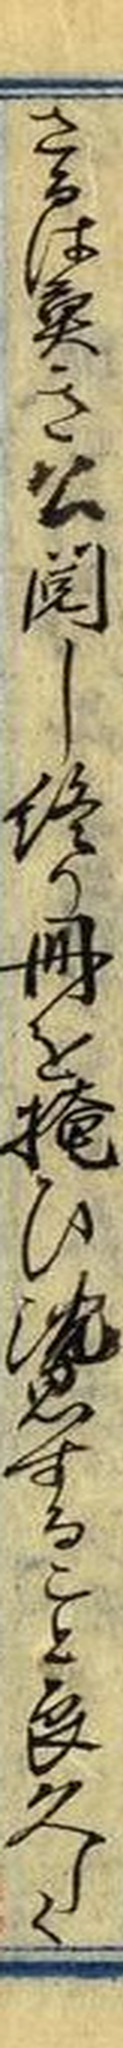さるは莫き公閲し終り冊を掩ひ沈思すること良久しく
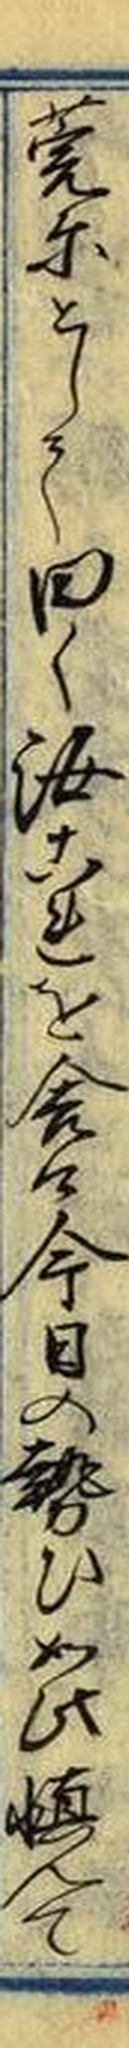莞爾として曰く汝これを舎ㇽ今日の勢ひ如此慎んて
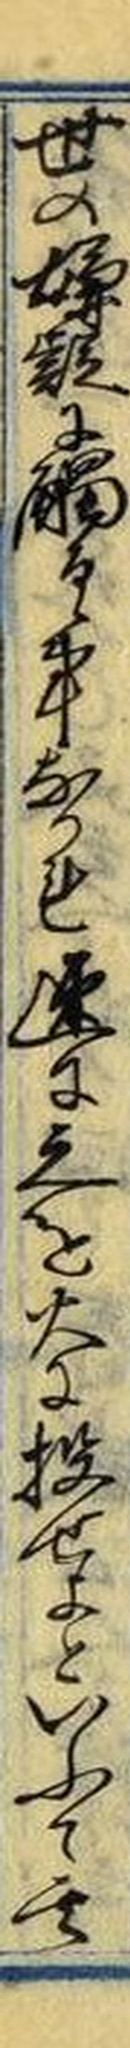世の嫌疑に触るゝ事なかれ速に之を火に投せよといふて其

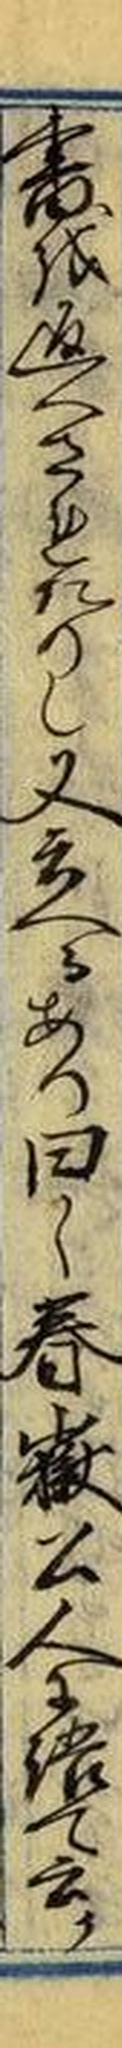書を返へされたりし又云へるあり曰く春嶽公人に語て云ク
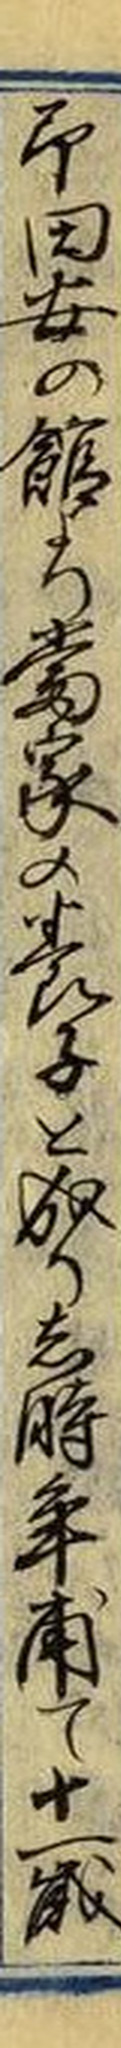予田安の館より当家の養子と成りし時年甫て十一歳
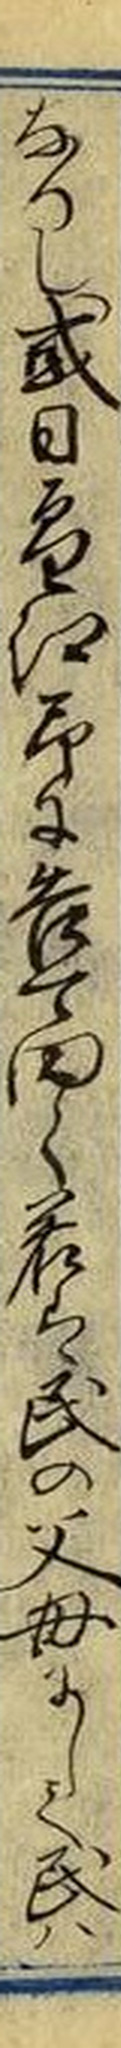なりし或日雪江予に告て曰く若は民の父母にして民ハ
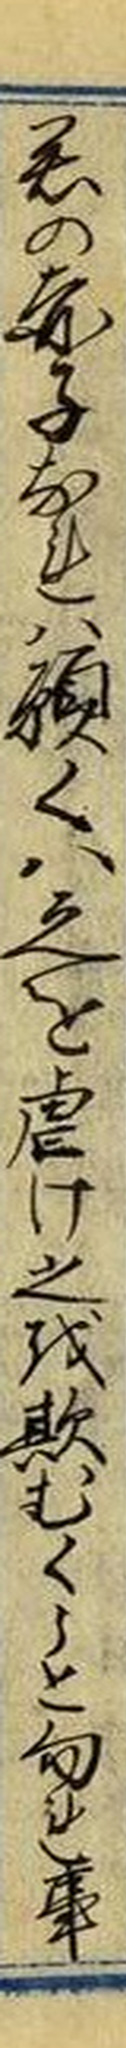君の赤子なれハ願くハ之を虐け之を欺むくこと勿れ事
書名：温古集 三巻
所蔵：福井県文書館 Fukui Prefectural Archives
